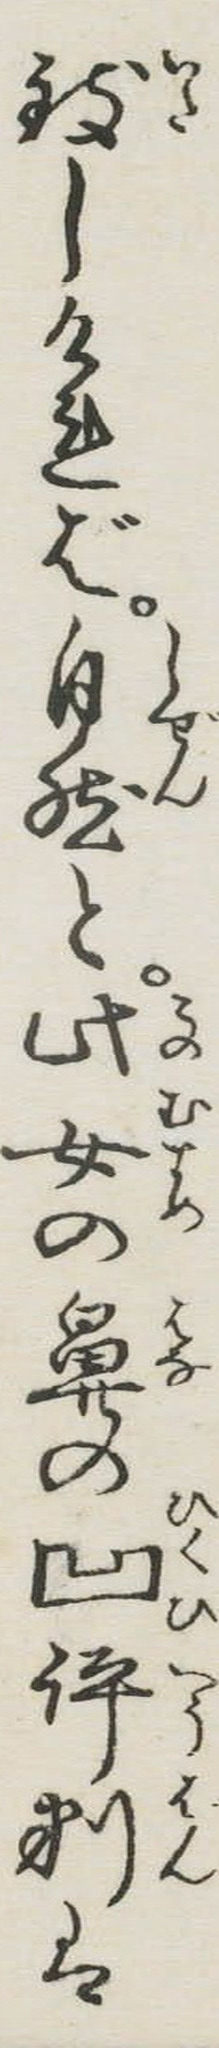致しければ。自然と。此女の鼻の凹評判は
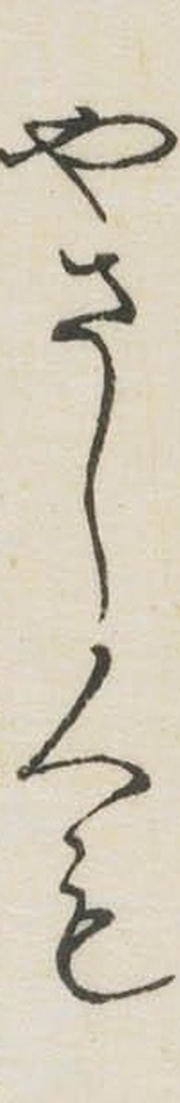やさしくも
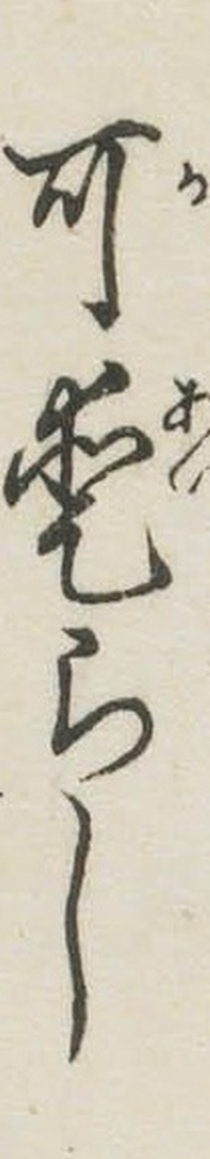可愛らし
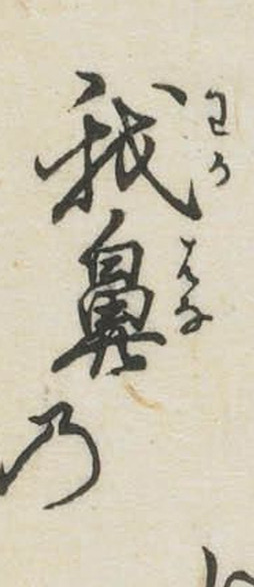我鼻の
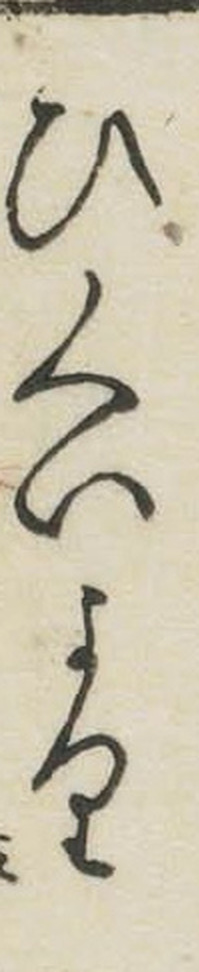ひくいより
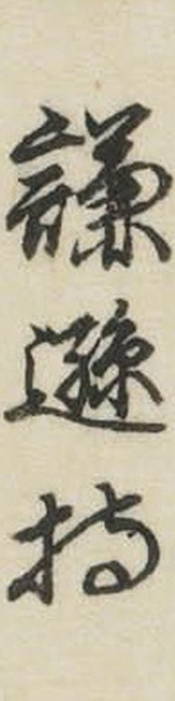謙遜持

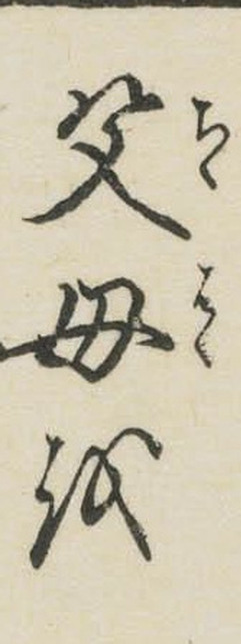父母を
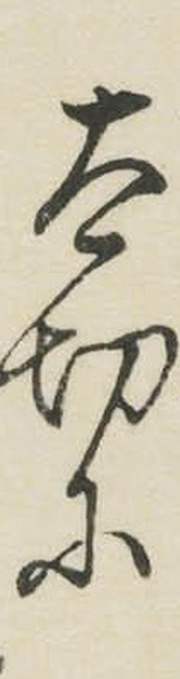太切に
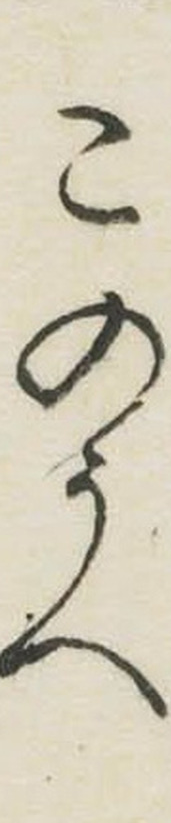このうへ

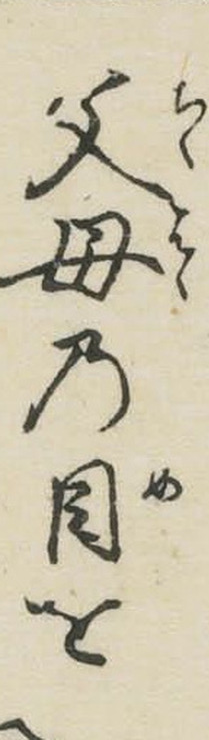父母の目を
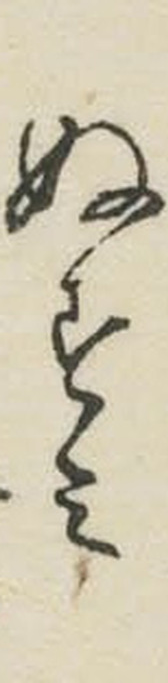ぬすみ
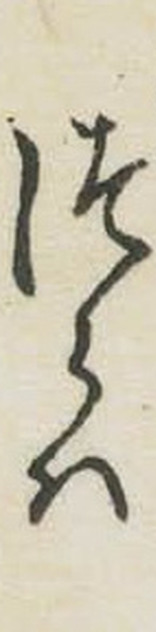づらは
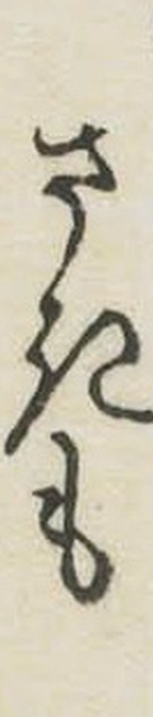さきも
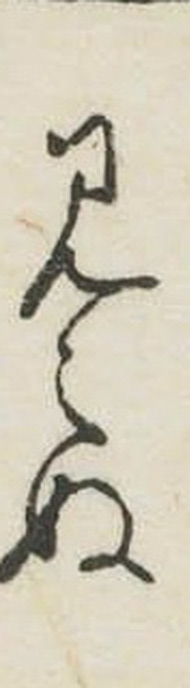見えぬ
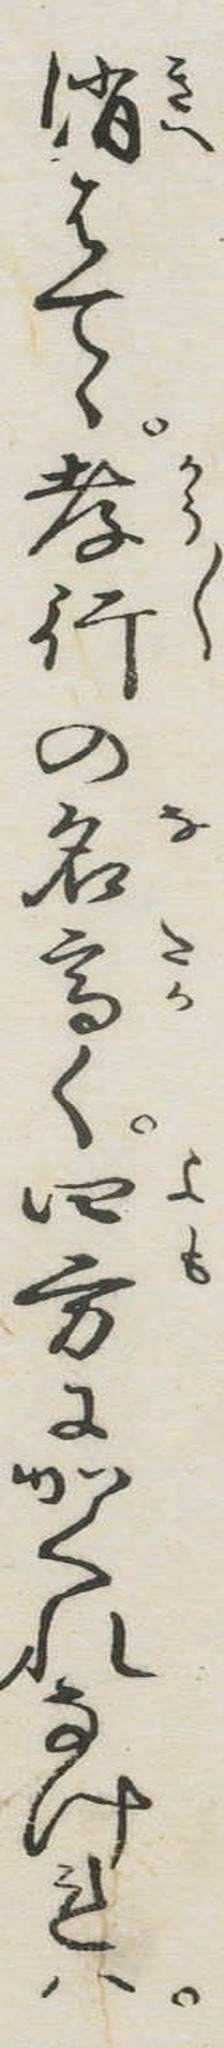消はてゝ。孝行の名高く。四方にかくれなけれは。
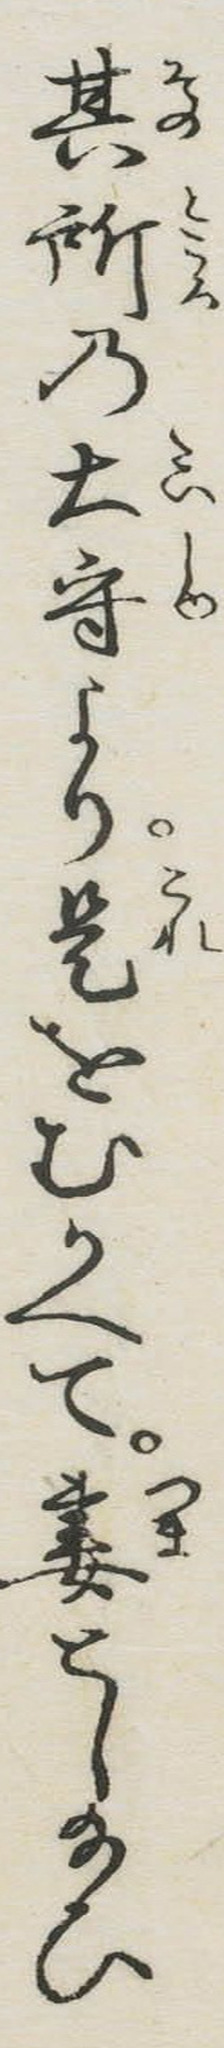其所の大守より。是をむかへて。妻とし給ひ
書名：福神おしへの小槌 2巻 上
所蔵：東京学芸大学教育コンテンツアーカイブ
